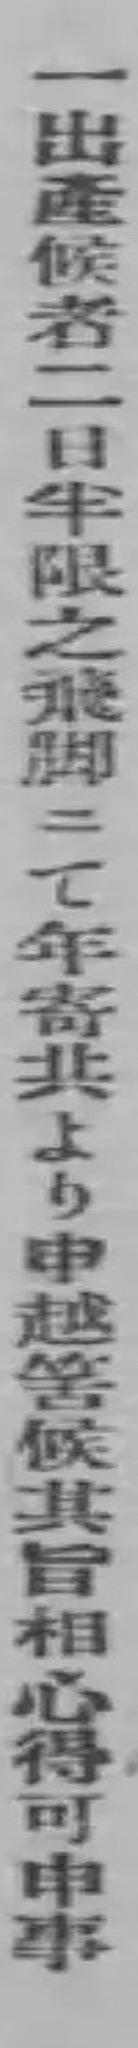一出産候者二日半限之飛脚ニて年寄共より申越筈候其旨相心得可申事
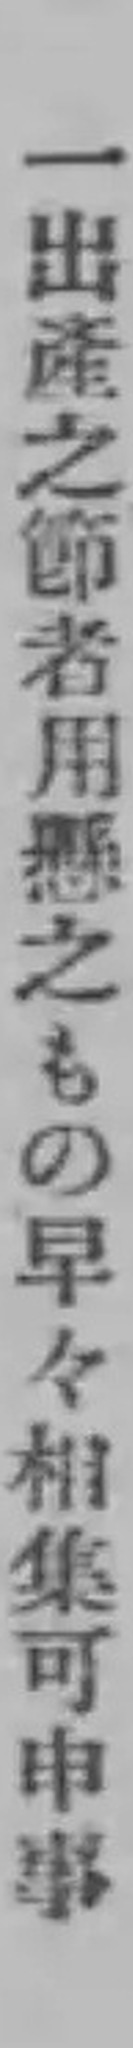一出産之節者用懸之もの早々相集可申事
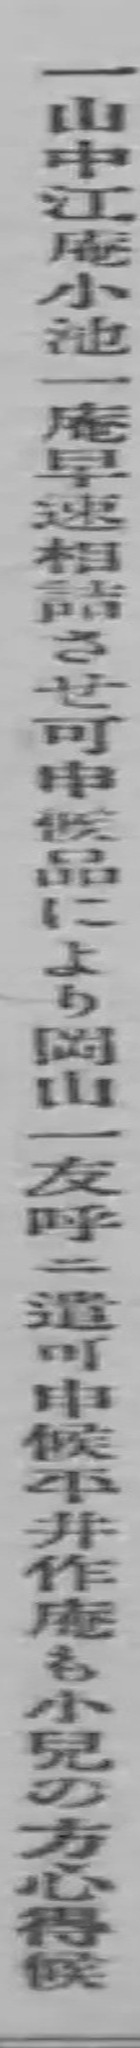一山中江庵小池一庵早速相詰させ可申候品により岡山一友呼ニ遣可申候平井作庵も小児の方心得候
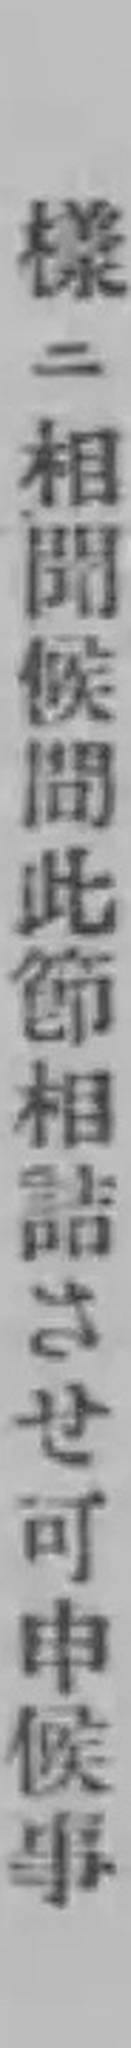用様ニ相聞候間此節相詰させ可申候事
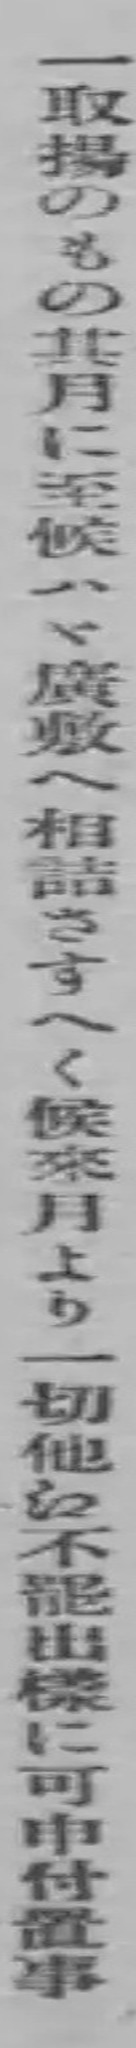一取揚のもの其月に至候はゞ広敷へ相詰さすへく候来月より一切他え不罷出様に可申付置事
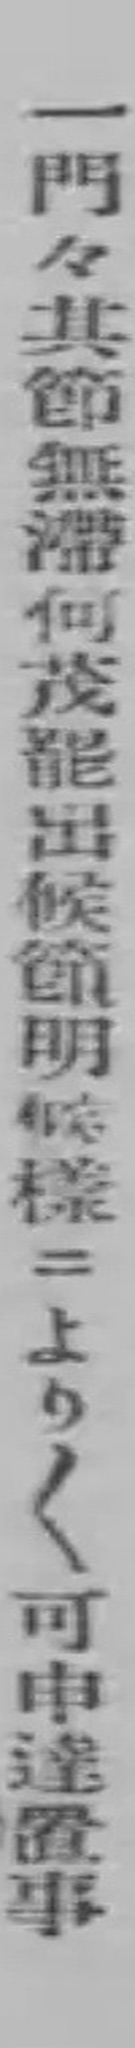一門々其節無滞何茂罷出候節明候様ニより〳〵可申達置事
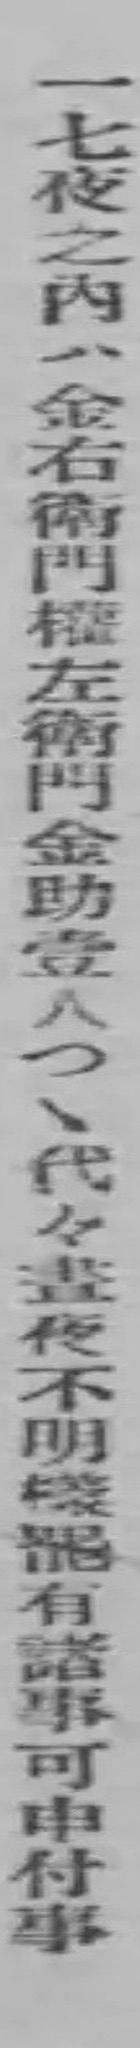一七夜之内は金右衛門権左衛門金助壱人つゝ代々昼夜不明様罷有諸事可申付事
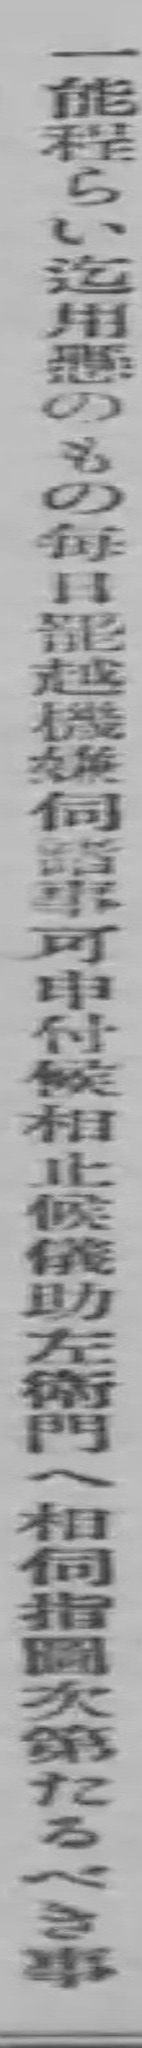一能程らい迄用懸のもの毎日罷越機嫌伺諸事可申付候相止候儀助左衛門へ相伺指図次第たるべき事
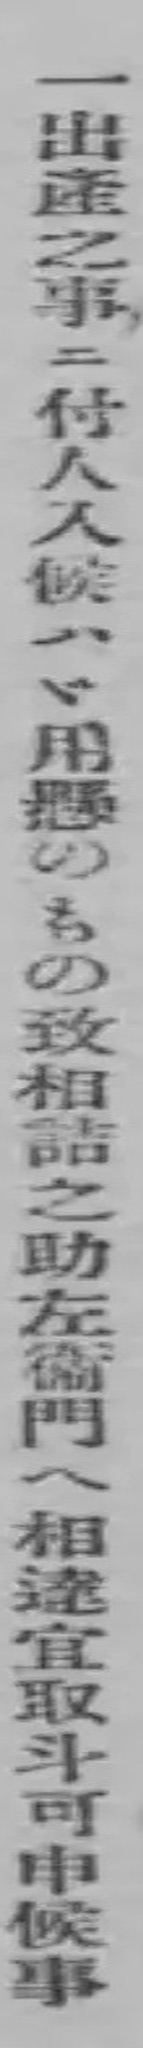一出産之事ニ付人入候はゞ用懸のもの致相詰之助左衛門へ相達宜取斗可申候事
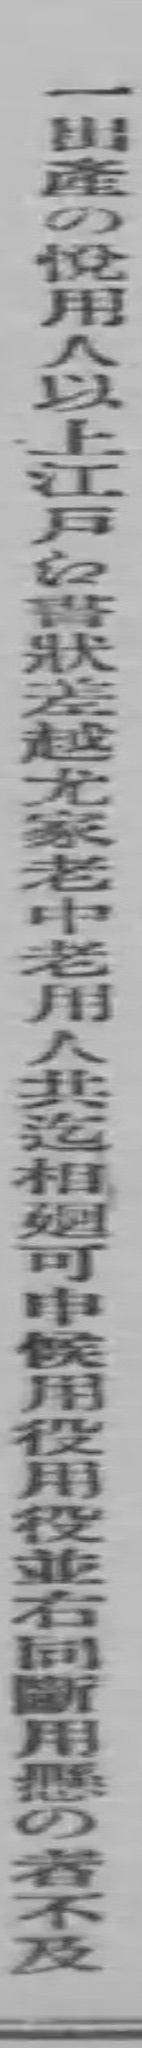一出産の悦用人以上江戸え書状差越尤家老中老用人共迄相廻可申候用役用役並右同断用懸の者不及
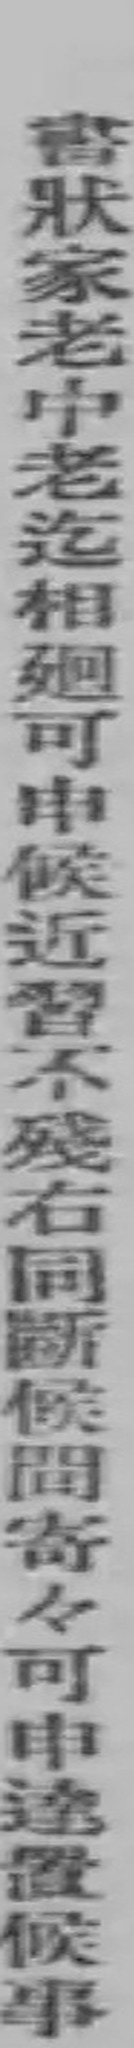書状家老中老用迄相廻可申候近習不残右同断候間寄々可申達置候事
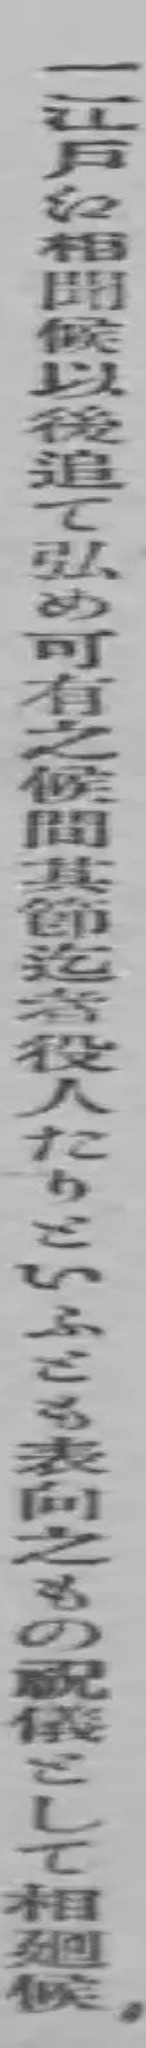一江戸え相聞候以後追て弘め可有之候間其節迄者役人たりといふとも表向之もの祝儀として相廻候
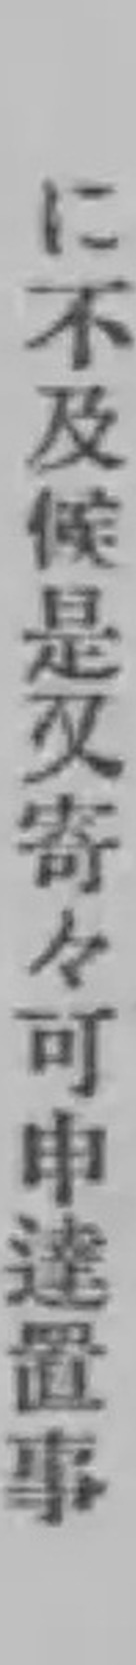に不及候是又寄々可申達置事
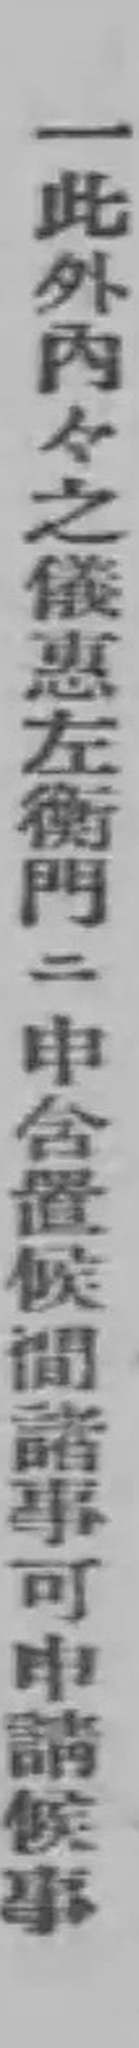一此外内々之儀恵左衛門ニ申含置候間所持諸事可申請候事
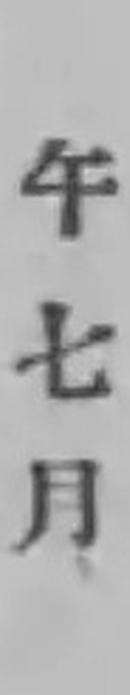午七月
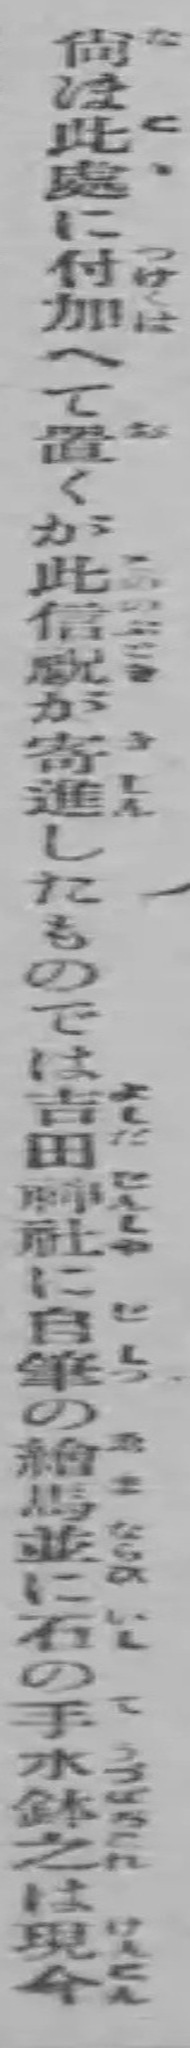尚ほ此処に付加へて置くが此信祝が寄進したものでは吉田神社に自筆の絵馬並に石の手水鉢之は現今
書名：豊橋市史談
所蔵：国立国会図書館 National Diet Library, JAPAN
